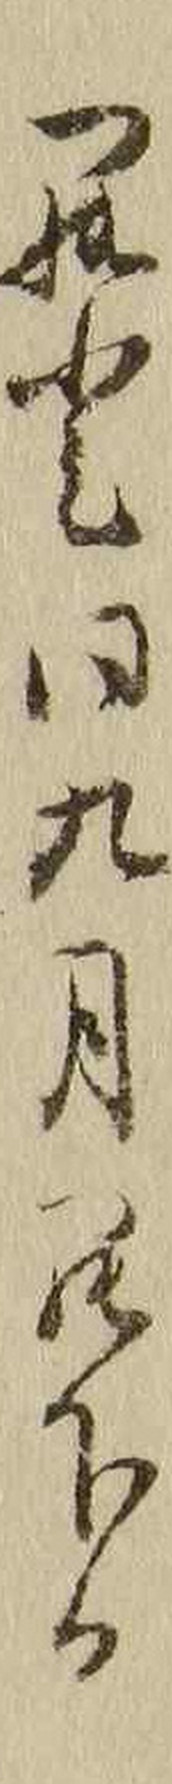罷登同九月罷下候
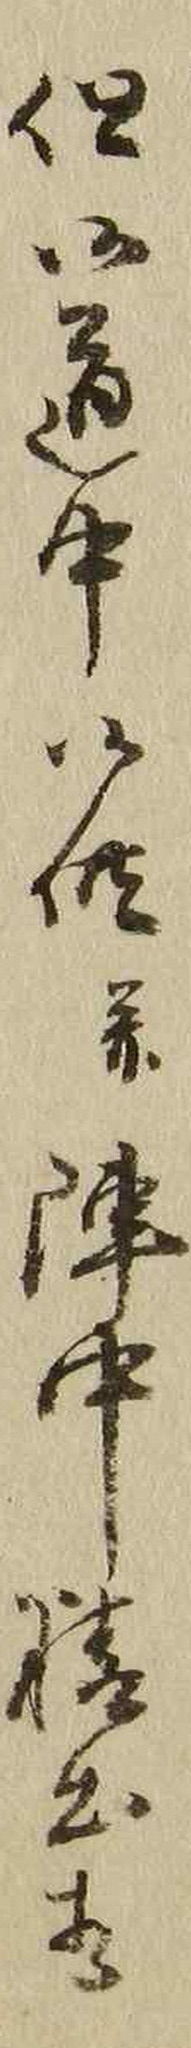但御通中御供并陣中精出相
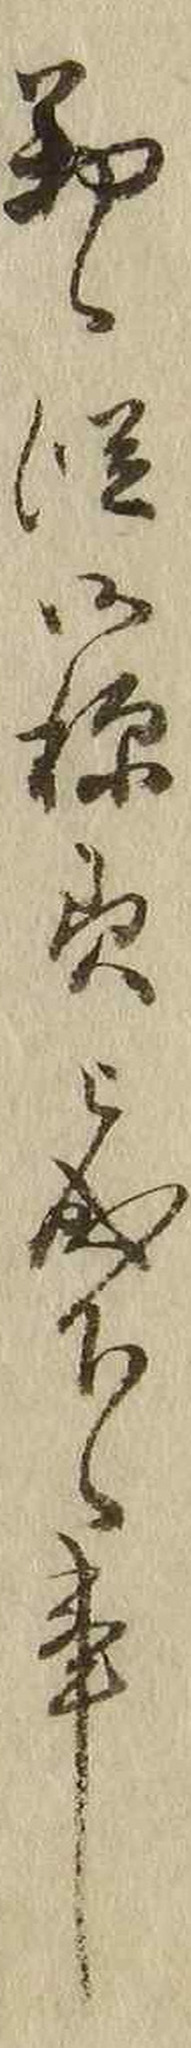勤候段御称美被成下候事
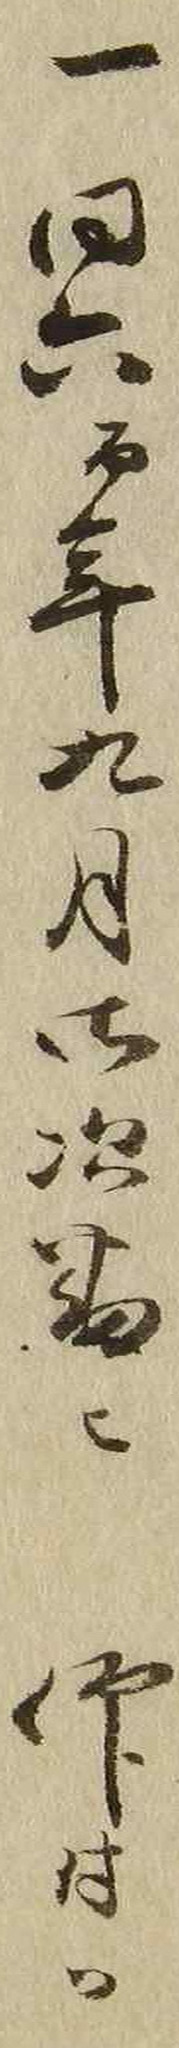一同六酉年九月御次番被仰付候
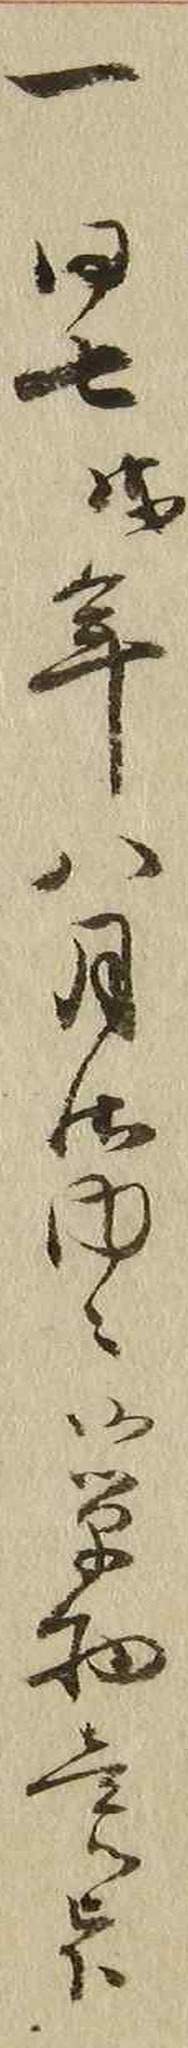一同七戌年八月御内々御単物壱ツ被下
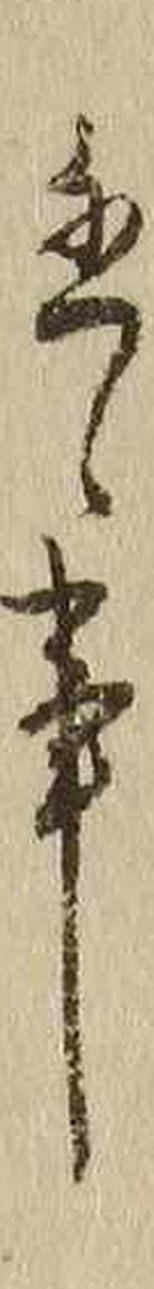置候事
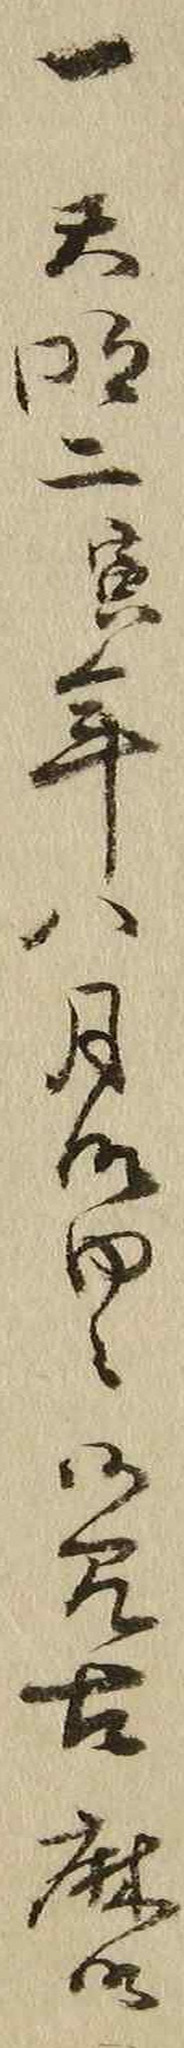一天明二寅年八月御内々御召古麻御
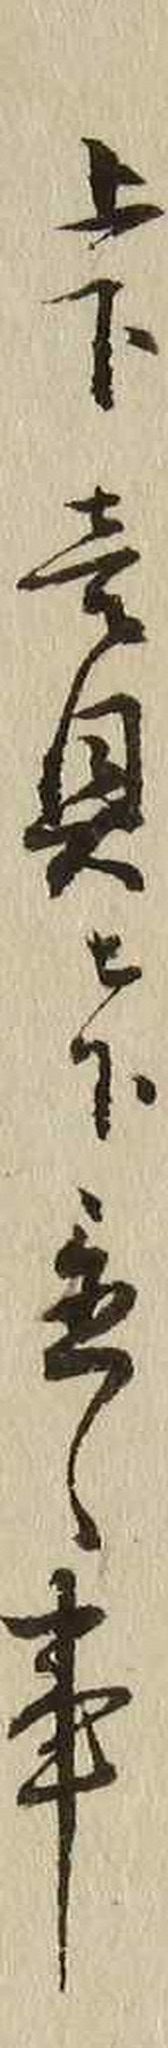上下壱具被下置候事
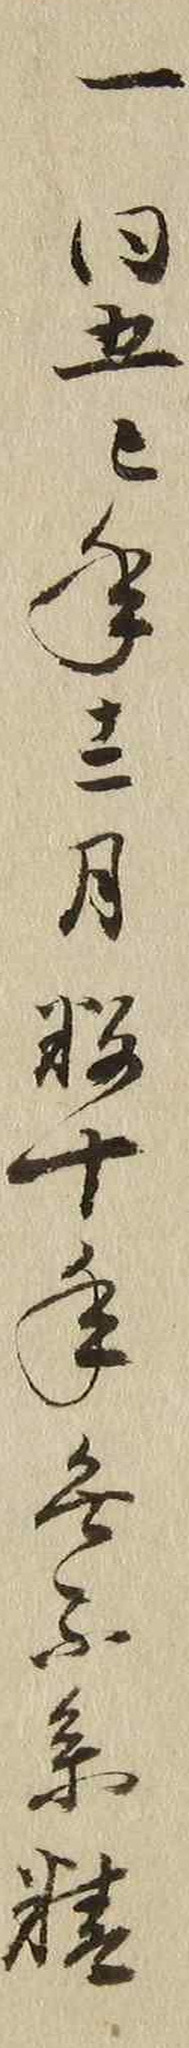一同五巳年十二月数十年無不参精
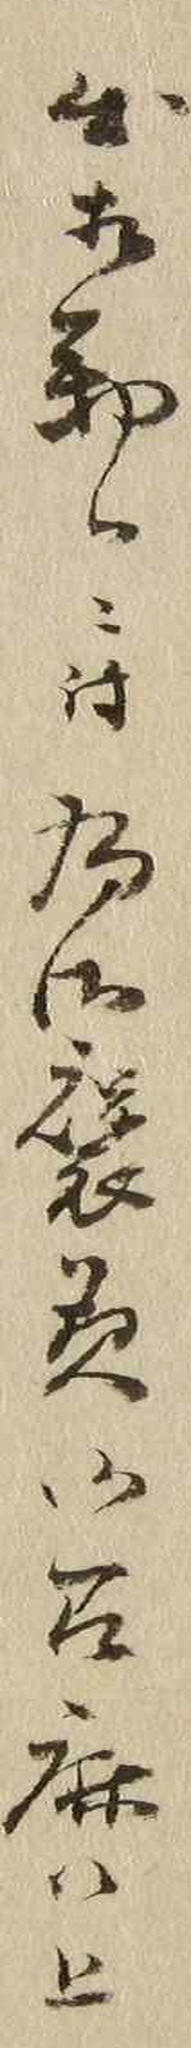出相勤候ニ付為御褒美御召麻御上
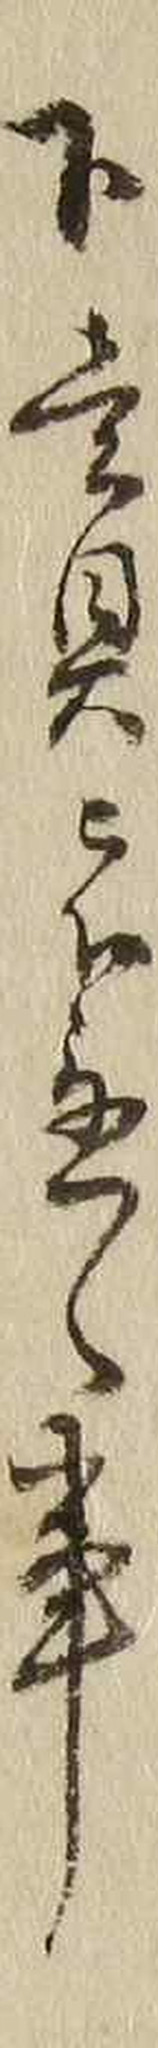下壱具被下置候事
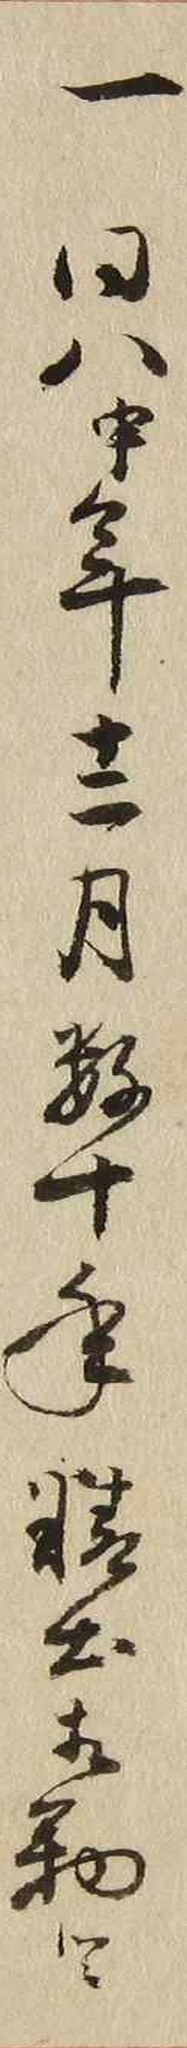一同八申年十二月数十年精出相勤候ニ
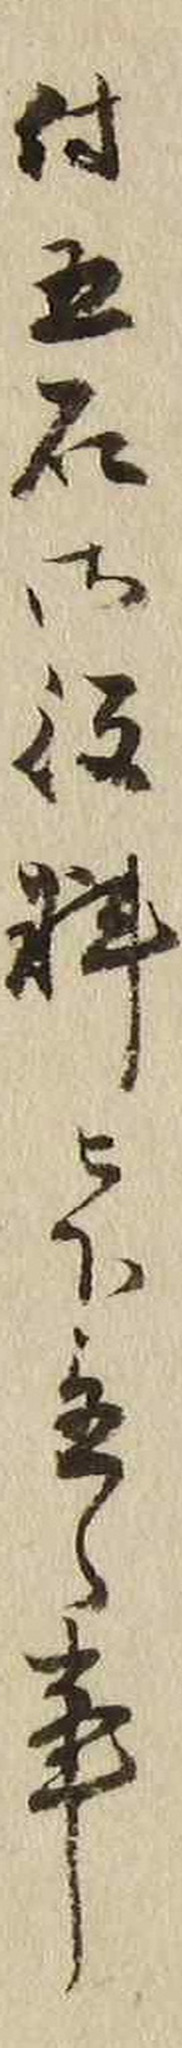付五石御役料被下置候事
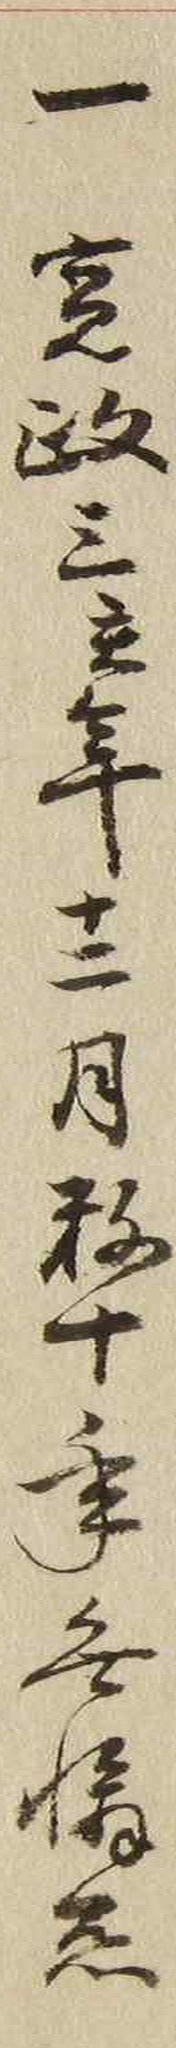一寛政三亥年十二月数十年無懈怠
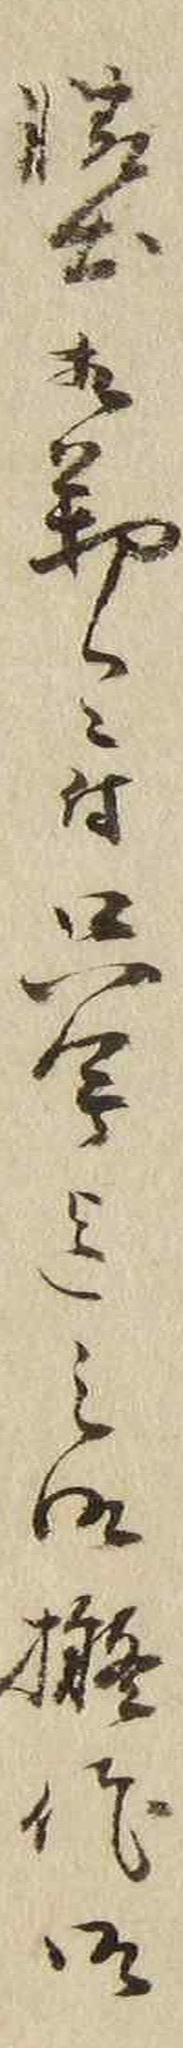精出相勤候ニ付只今迄之御擬作御
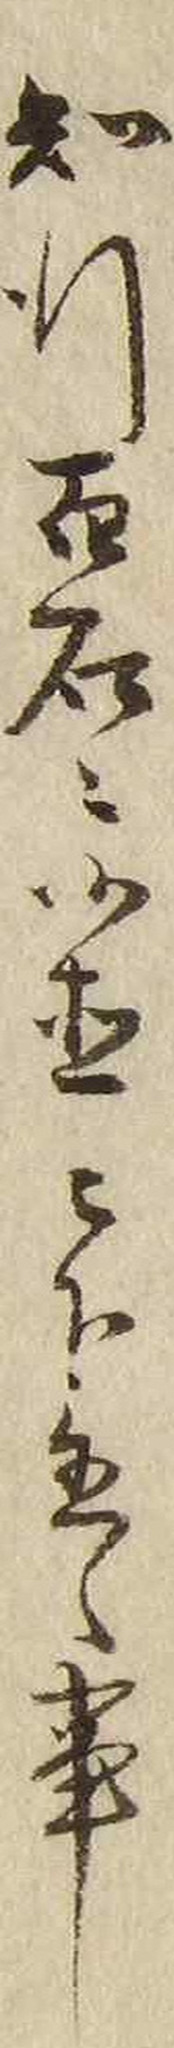知行百石ニ御直被下置候事
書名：諸士系譜　巻之232　け之部1
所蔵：会津若松市立会津図書館
